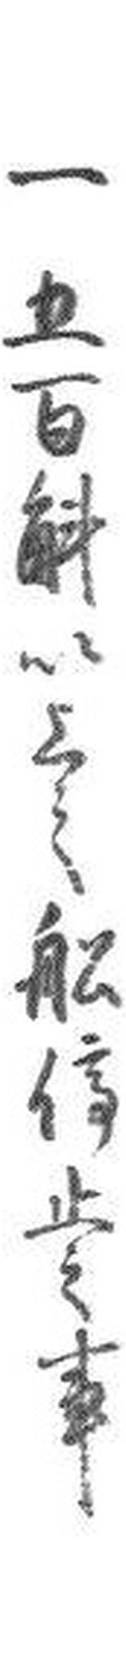一五百斛以上之舩停止之事
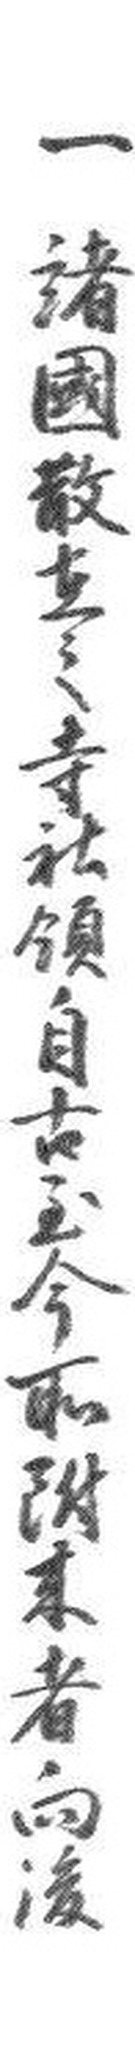一諸国散在之寺社領自古至今所附来者向後
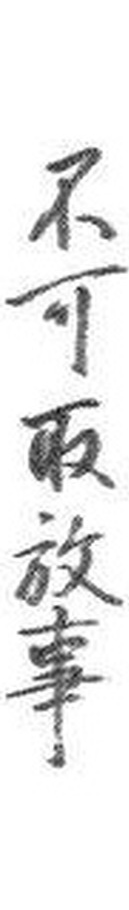不可取放事
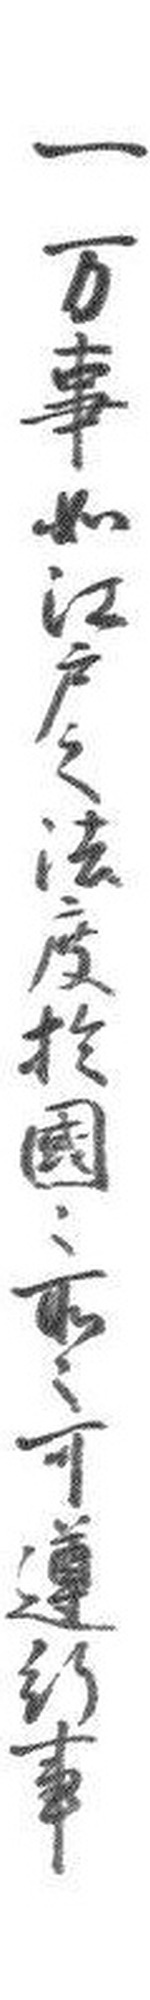一万事如江戸之法度於国々所々可遵行事
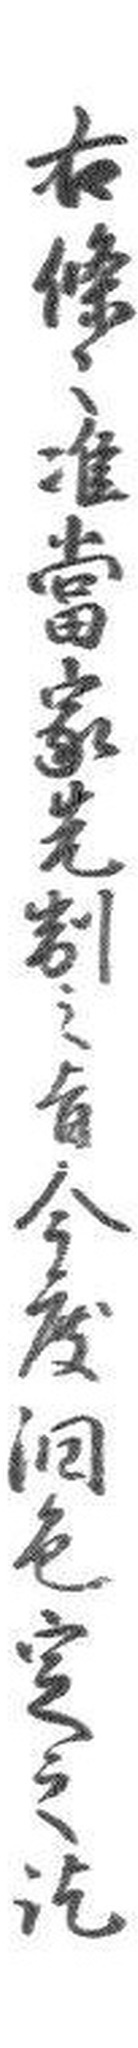右条々准当家先制之旨今度潤色定之訖
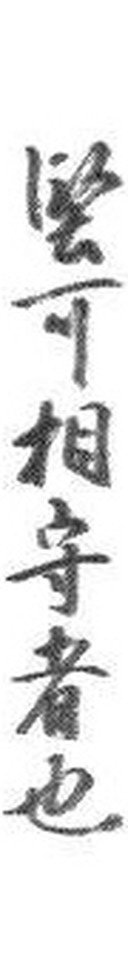堅可相守者也
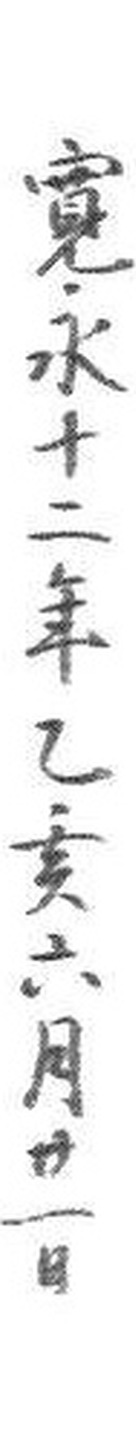寛永十二年乙亥六月廿一日

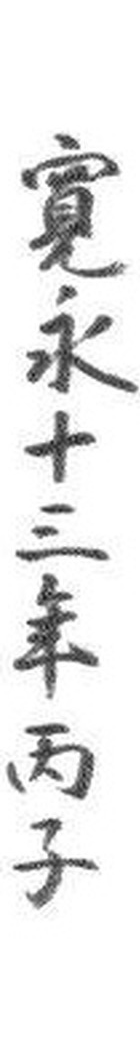寛永十三年丙子
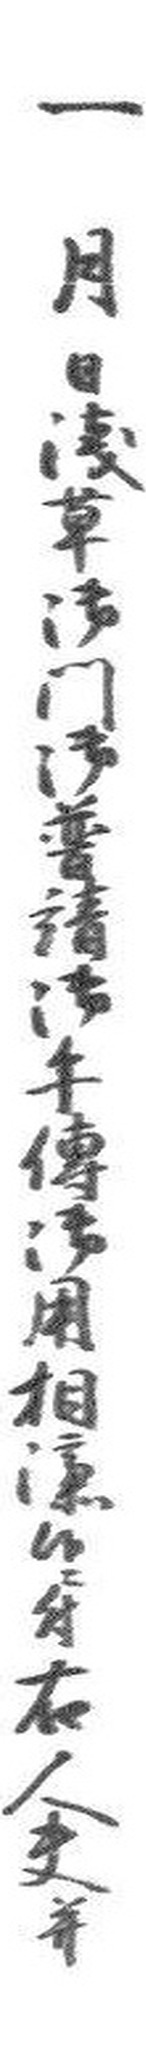一月日浅草御門御普請御手伝御用相済候ニ付右人夫并
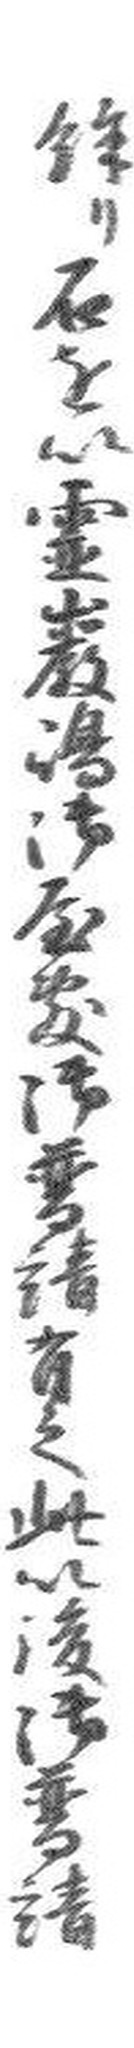余リ石を以霊巖島御屋敷御普請有之此以後御普請
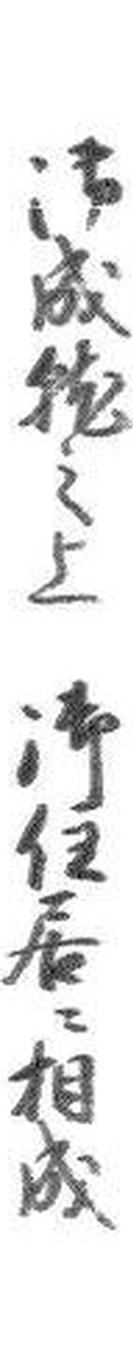御成就之上御住居ニ相成
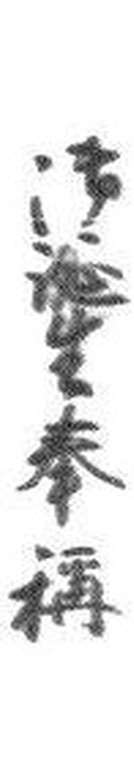御誕生奉称

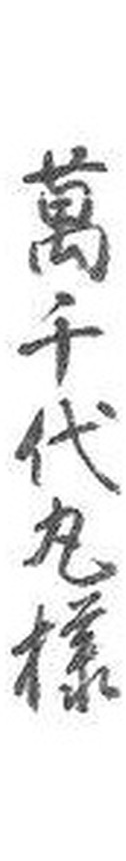萬千代丸様
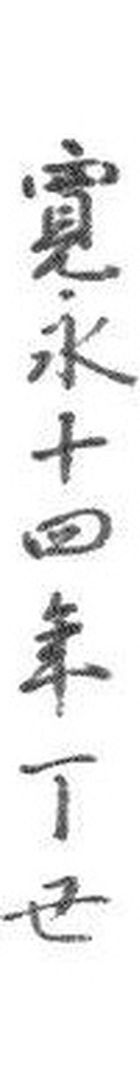寛永十四年丁丑
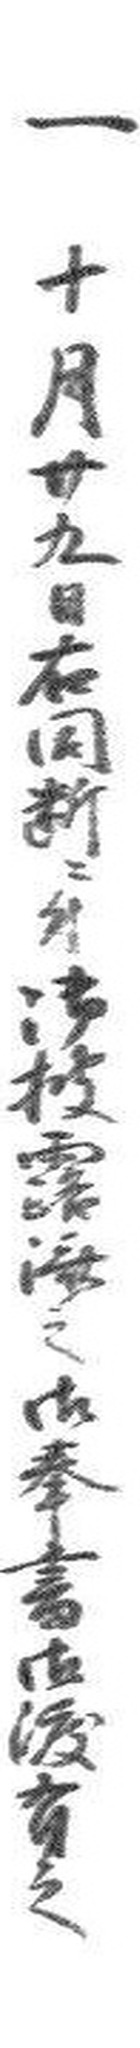一十月廿九日右同断ニ付御披露済之御奉書御渡有之
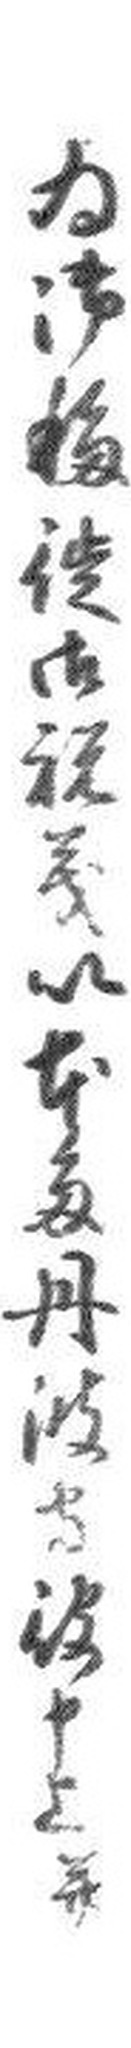為御移徙御祝義以本多丹波守被申上并
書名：家譜 四 忠昌公 従寛永七年到正保四年
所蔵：福井県文書館 Fukui Prefectural Archives
